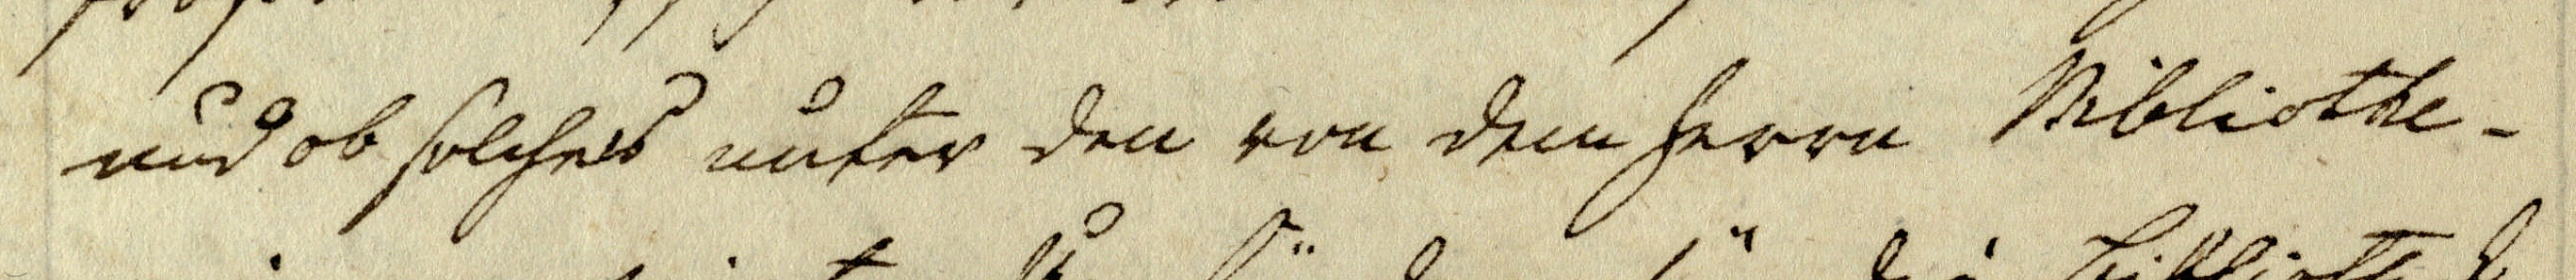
und ob solches unter den von dem Herrn Bibliothe¬
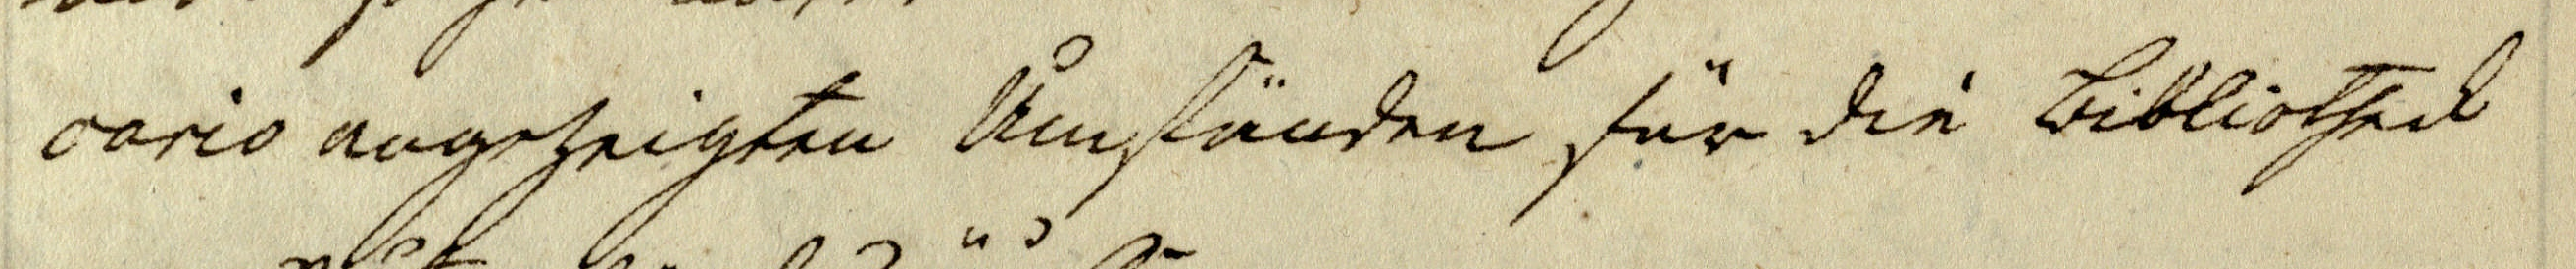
cario angezeigten Umständen für die Bibliotheck
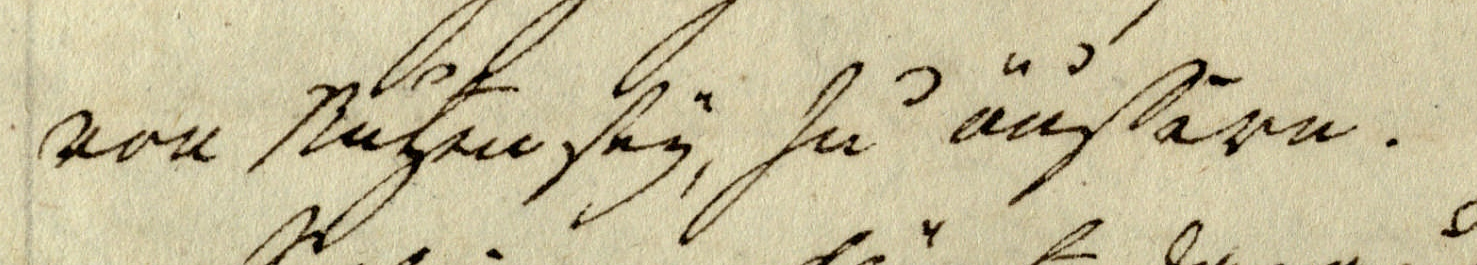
von Nutzen seÿ, zu äussern.
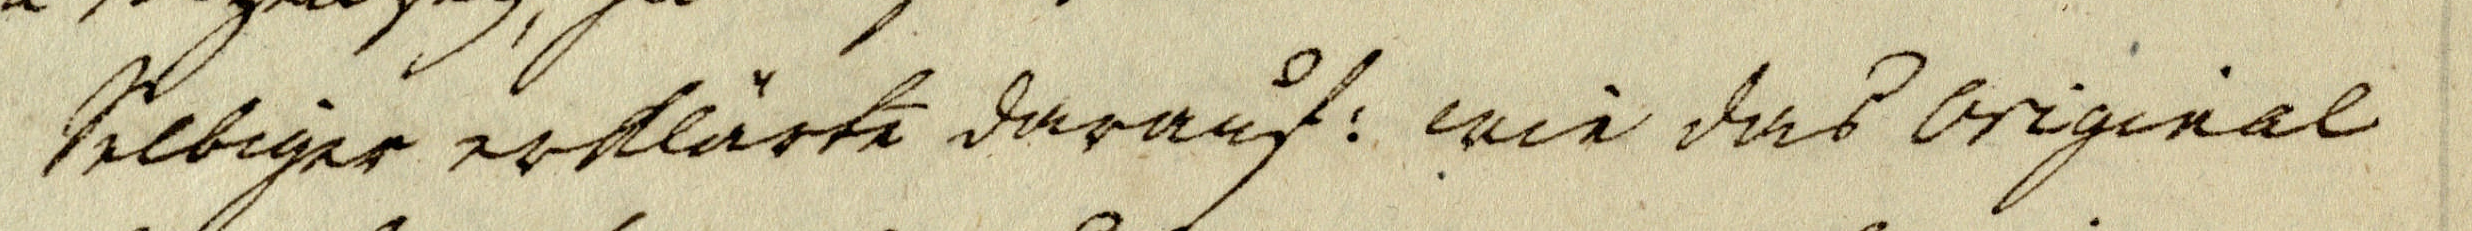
Selbiger erklärte darauf: wie das Original
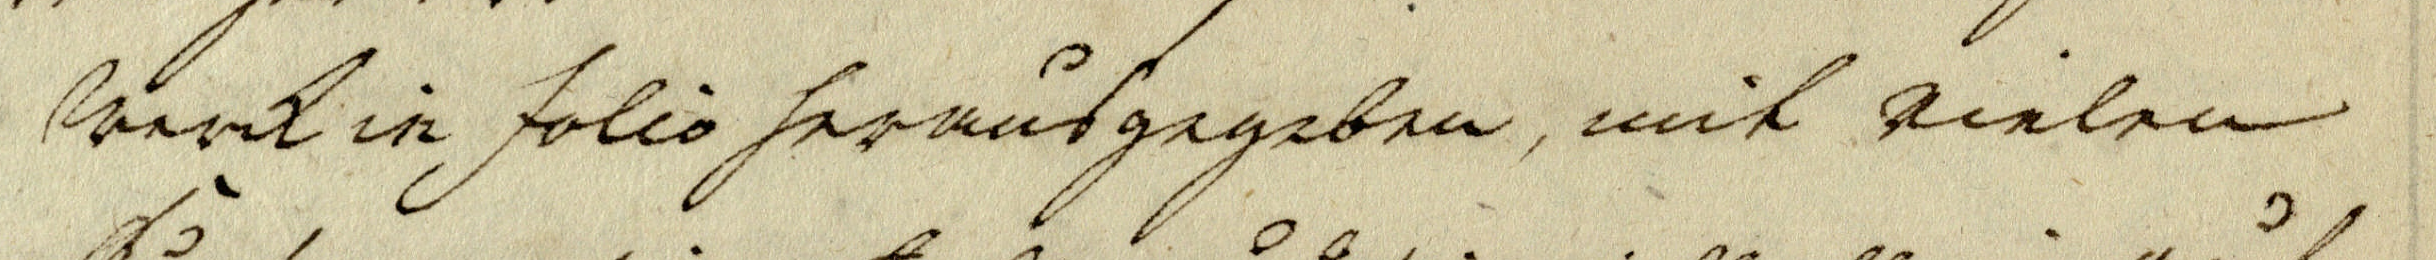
Werck in Folio herautgegeben, mit vielen
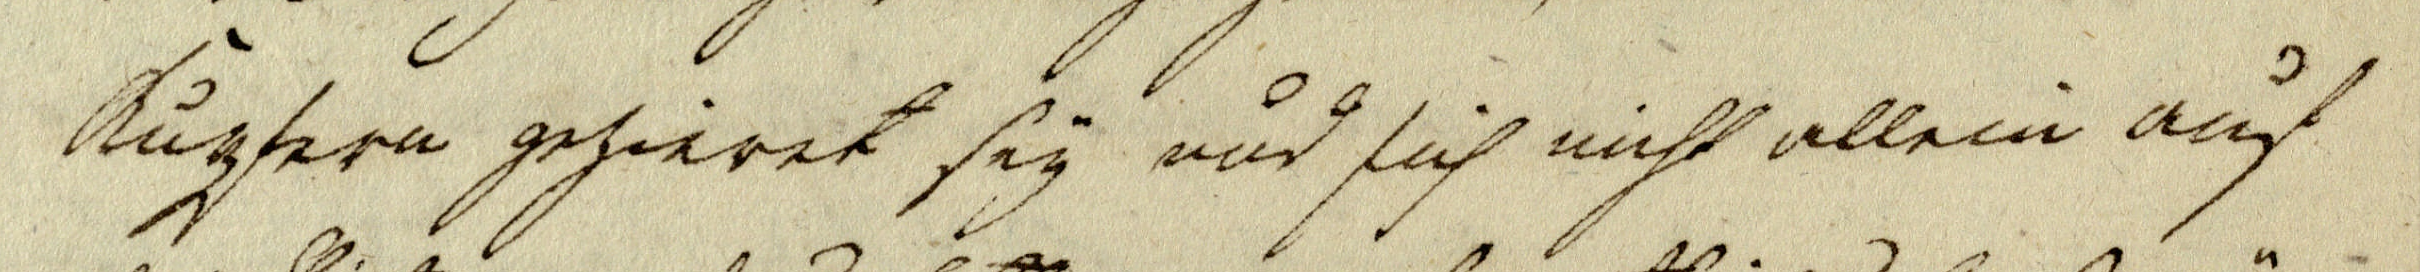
Kupfern gezieret seÿ und sich nicht allein auf
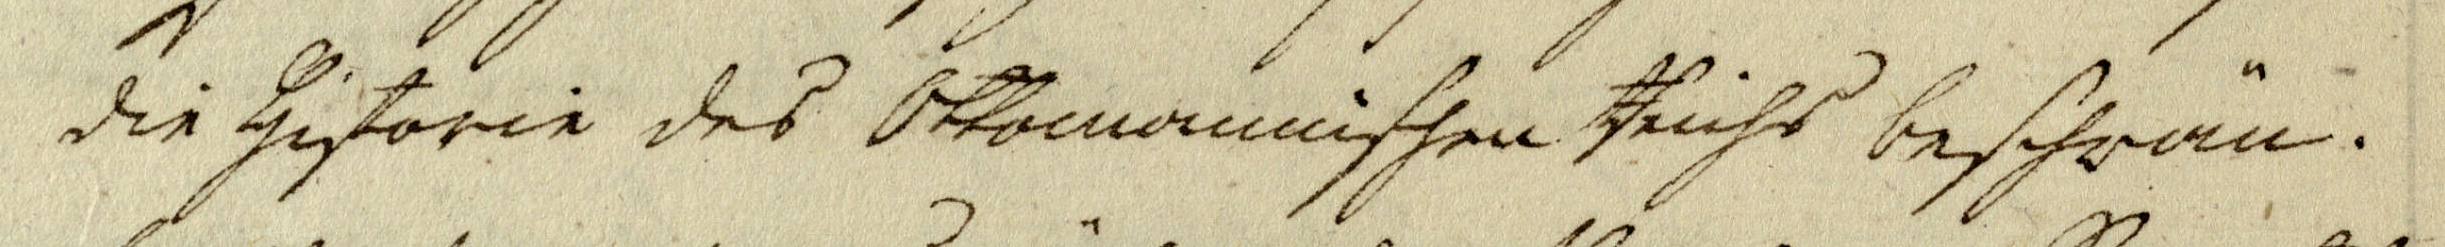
die Historie des Ottomannischen Reichs beschrän¬
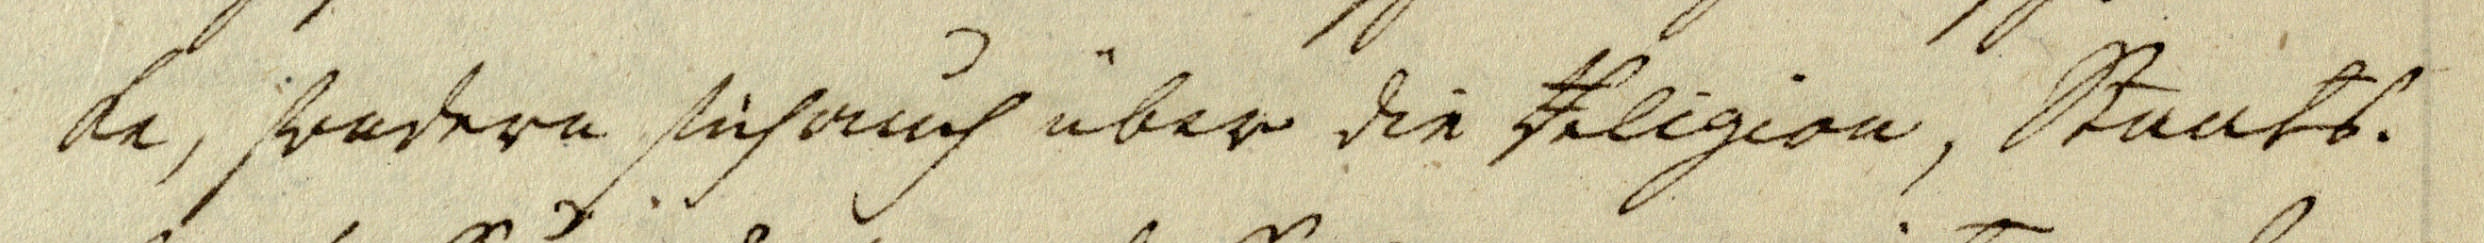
ke, sondern sich auch über die Religion, Staats¬
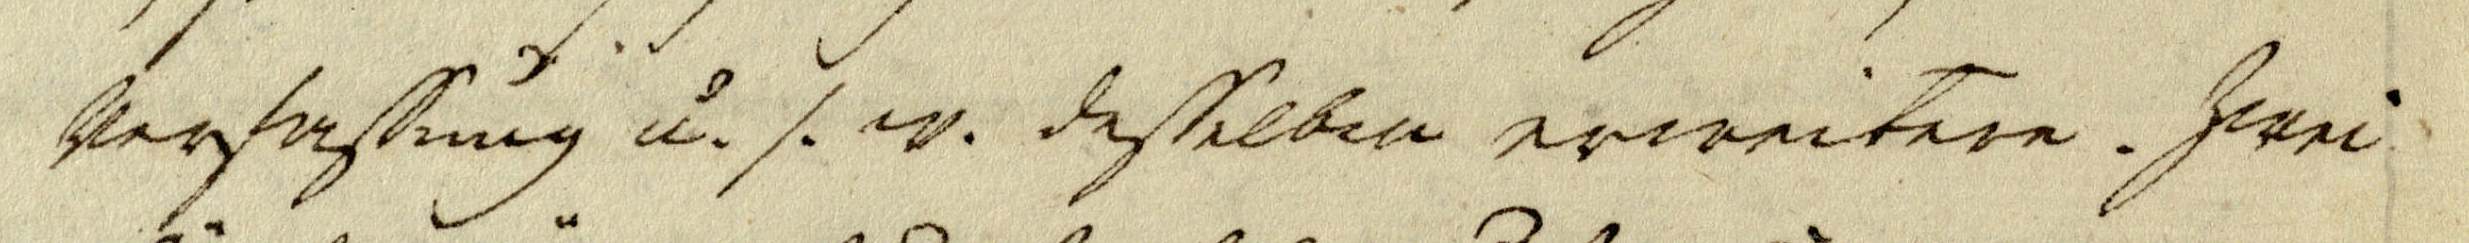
Verfassung u. s. w. desselben erweitere. Zwei
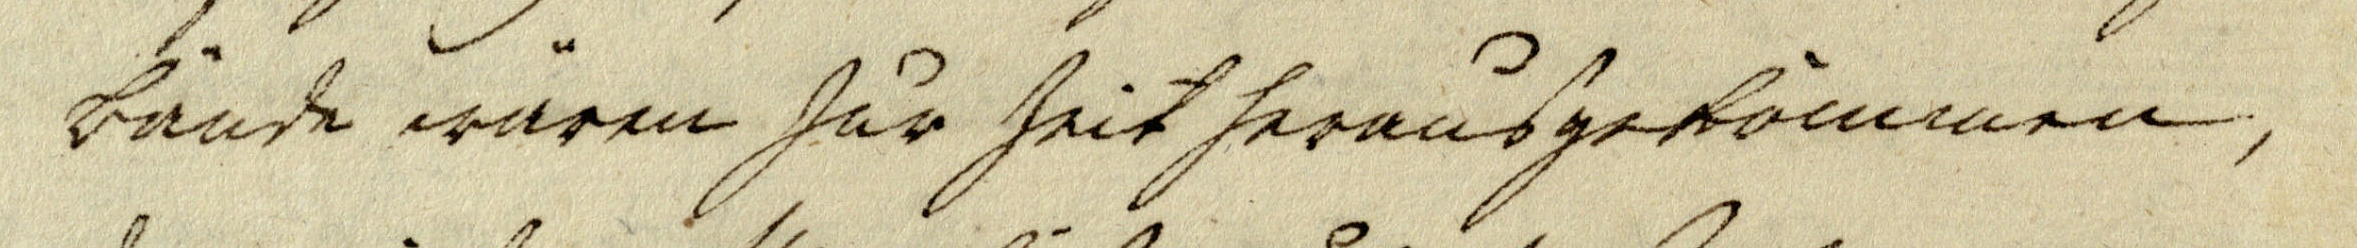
Bände wären zur Zeit herausgekommen,
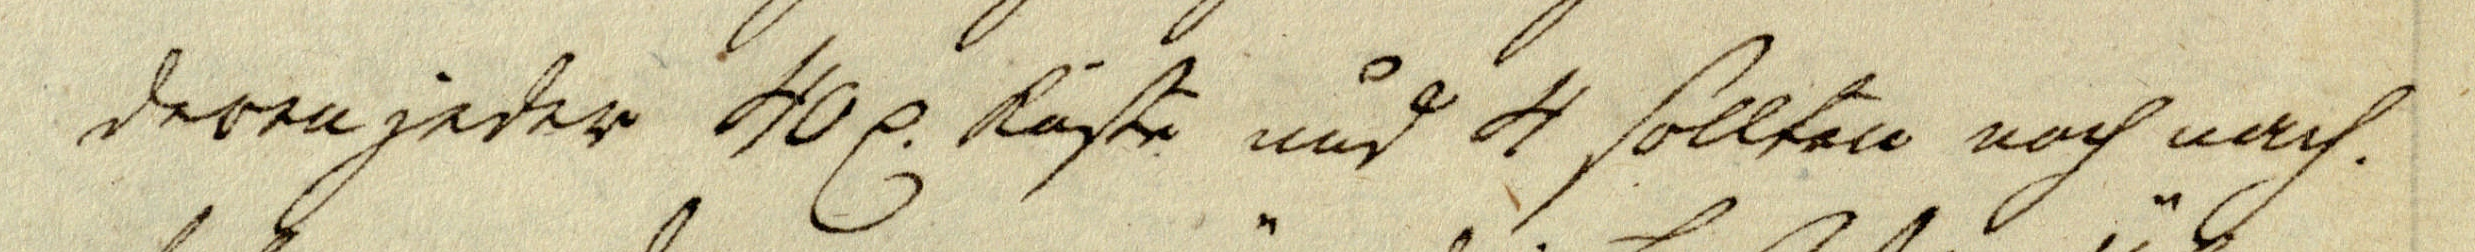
deren jeder 40 l. koste und 4 sollten noch nach¬
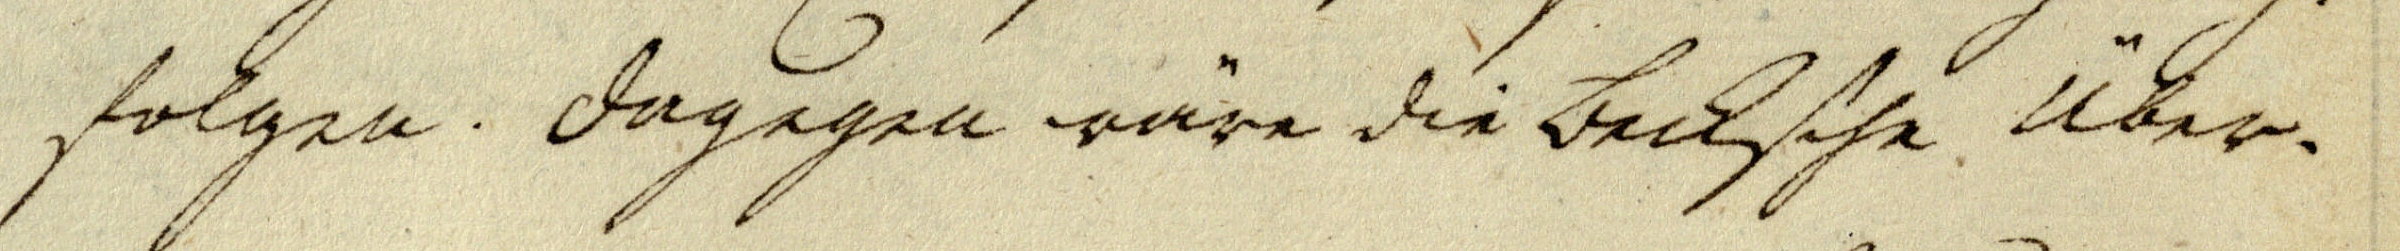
folgen. Dagegen wäre die Becksche Über¬
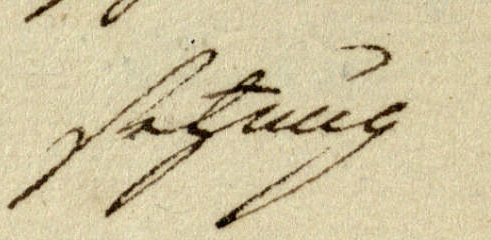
setzung
